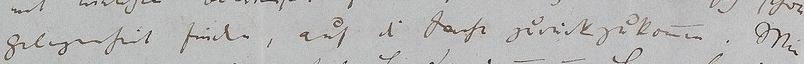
Gelegenheit finden, auf die Sache zurückzukommen. Wie
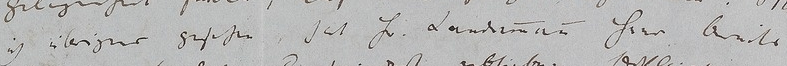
ich übrigens gesehen, hat Hr. Landammann Heer bereits
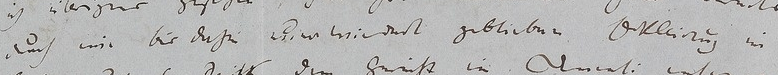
durch eine bis dahin unerwiedert gebliebne Erklärung im
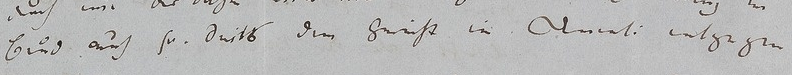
Bund auch sn. Seits dem Gerücht ein Dementi entgegen-
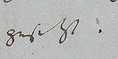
gesetzt.
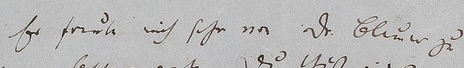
Es freute mich sehr von Dr. Blumer zu
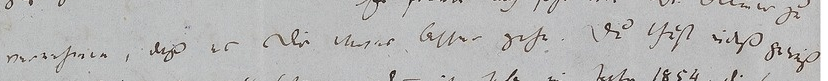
vernehmen, daß es Dir etwas besser gehe. Du thust indeß gewiß
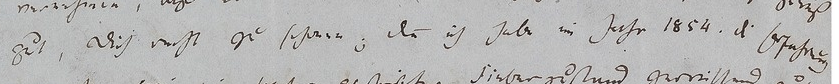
gut, Dich recht zu schonen; denn ich habe im Jahr 1854. die Erfahrung
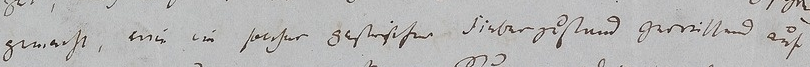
gemacht, wie ein solcher gastrischer Fieberzustand zerrüttend auf
